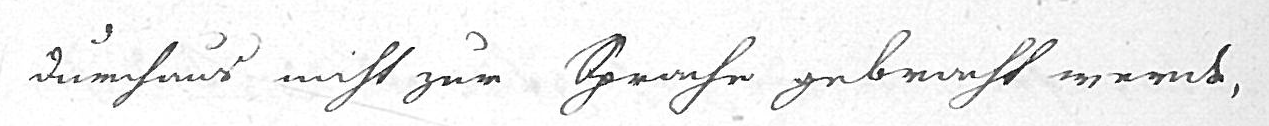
durchaus nicht zur Sprache gebracht werde,
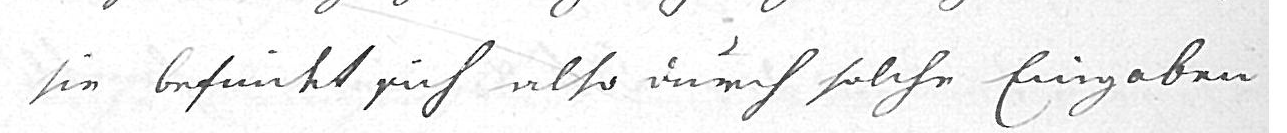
sie befindet sich also durch solche Eingaben
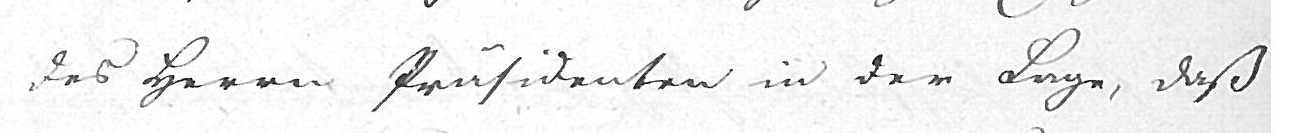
des Herrn Präsidenten in der Lage, daß
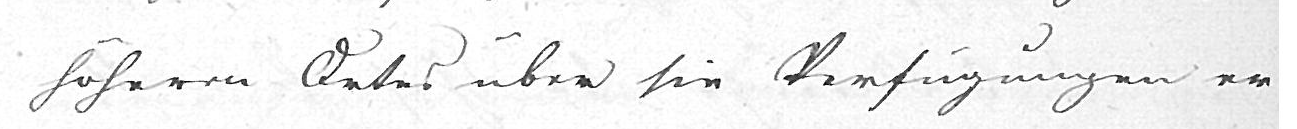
höheren Ortes über sie Verfügungen er-
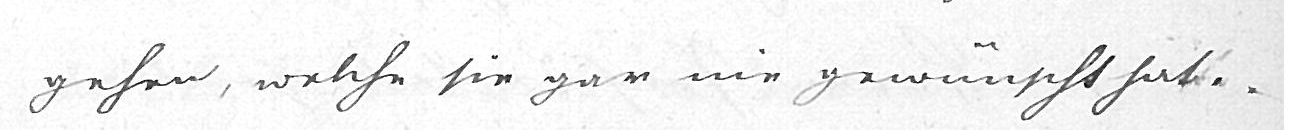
gehen, welche sie gar nicht gewünscht hat.
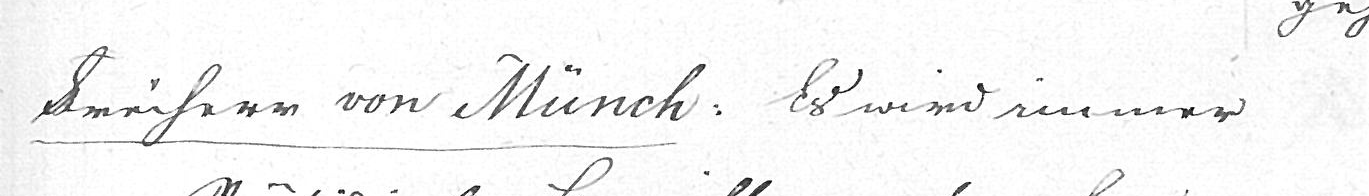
Freiherr von Münch: Es wird immer
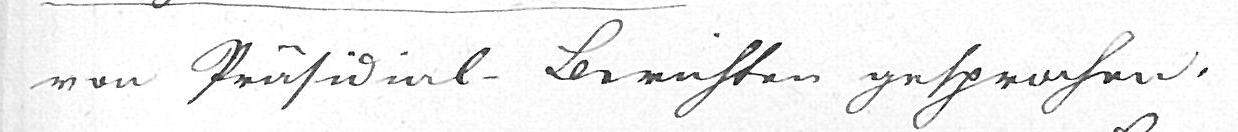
von Präsidial-Berichten gesprochen.
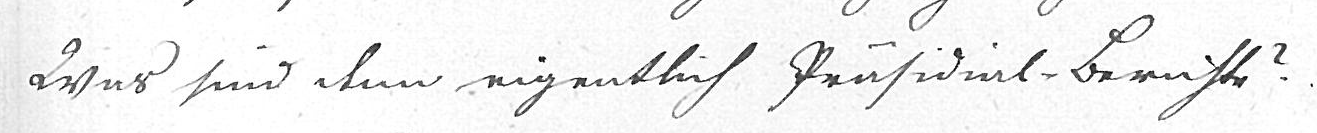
Was sind denn eigentlich Präsidial-Berichte?
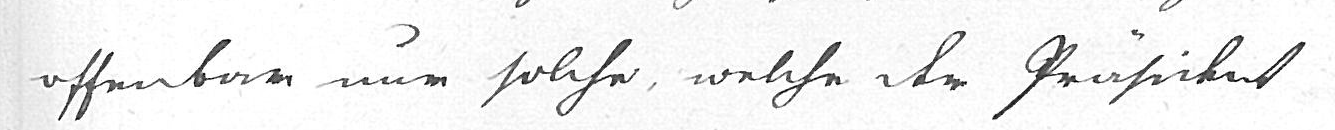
offenbar nur solche, welche der Präsident
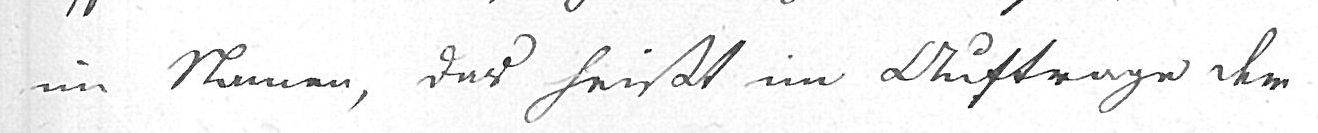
im Namen, das heißt im Auftrage der
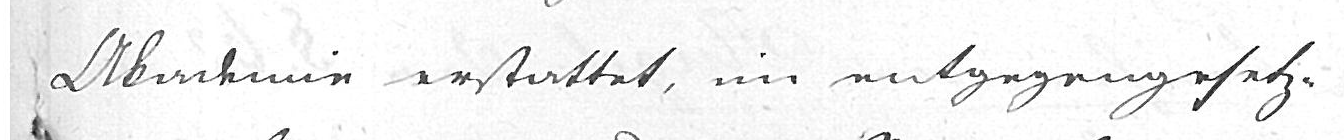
Akademie erstatt, im entgegengesetz-
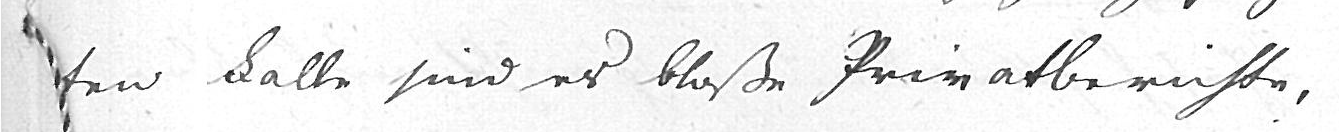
ten Fall sind es bloße Privatberichte,
